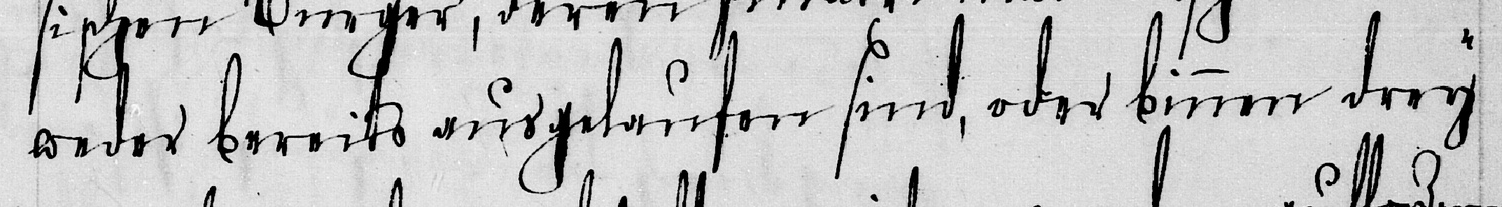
weder bereits ausgelaufen sind, oder binnen drey
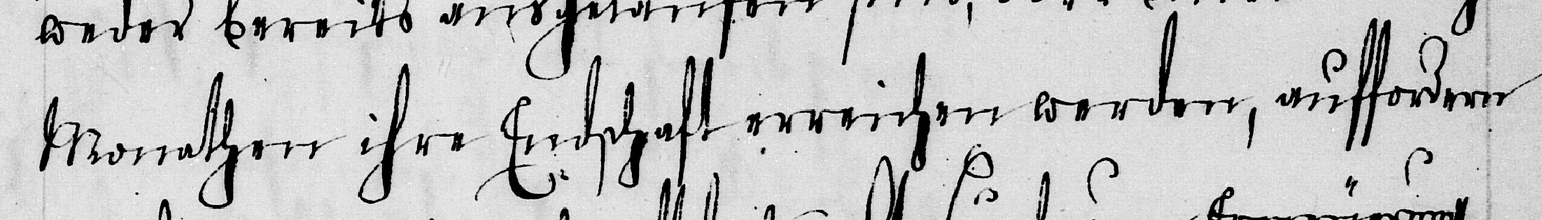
Monathen ihre Endschaft erreichen werden, auffordern
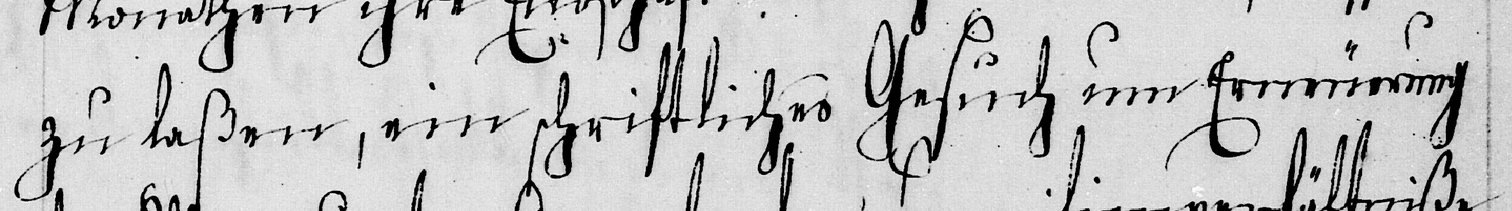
zu laßen, ein schriftliches Gesuch um Erneuerung
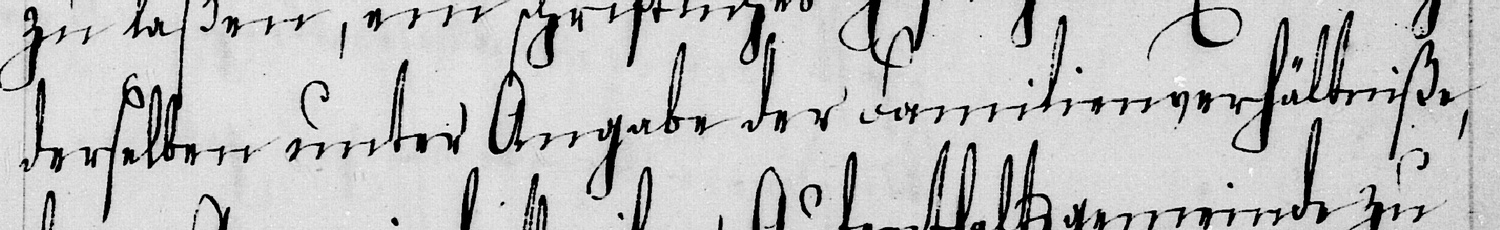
derselben unter Angabe der Familienverhältniße,
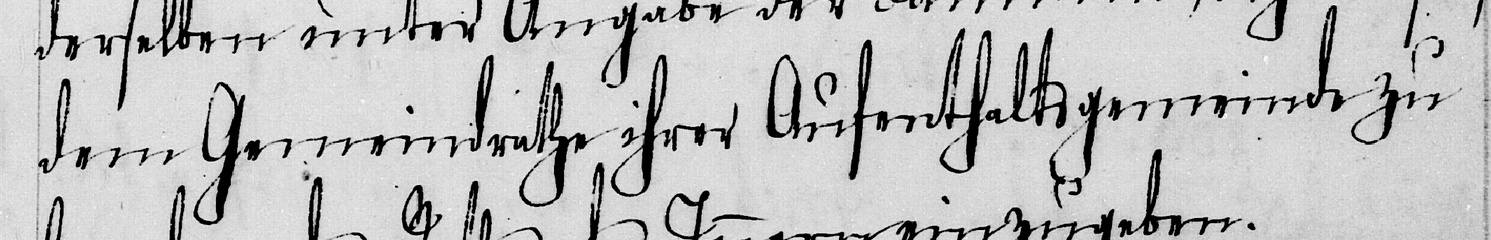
dem Gemeindrathe ihrer Aufenthaltsgemeinde zu
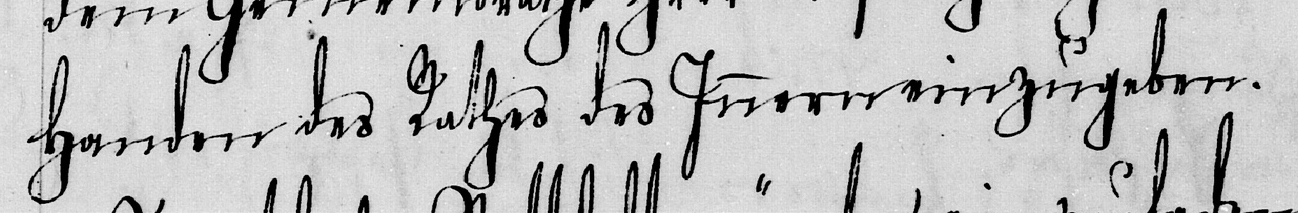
Handen des Rathes des Innern einzugeben.
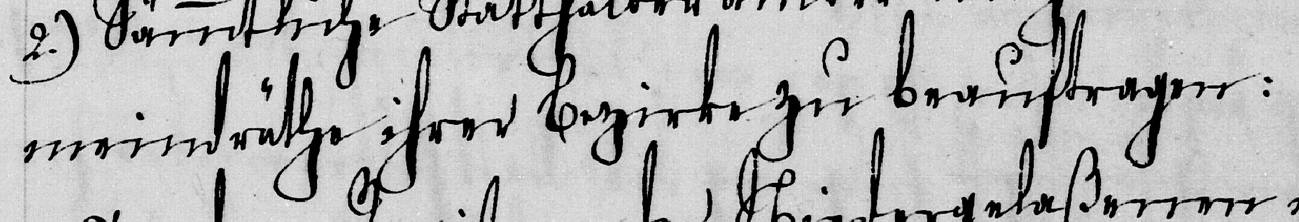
meindräthe ihrer Bezirke zu beauftragen:
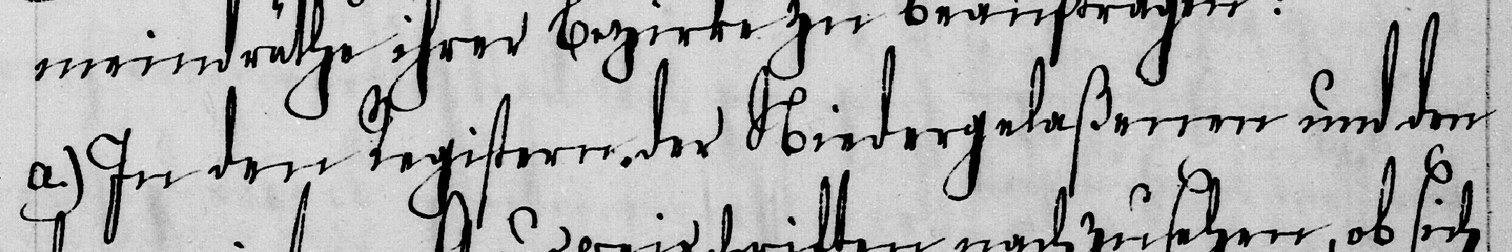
a.) In den Registern der Niedergelaßenen und den
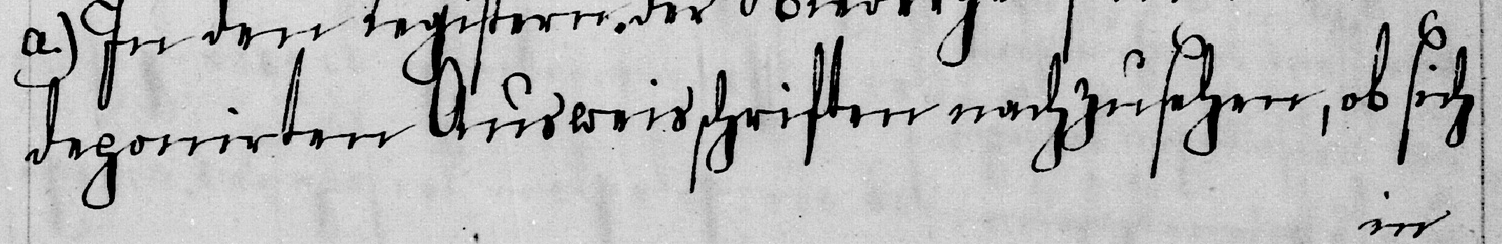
deponirten Ausweisschriften nachzusehen, ob sich
